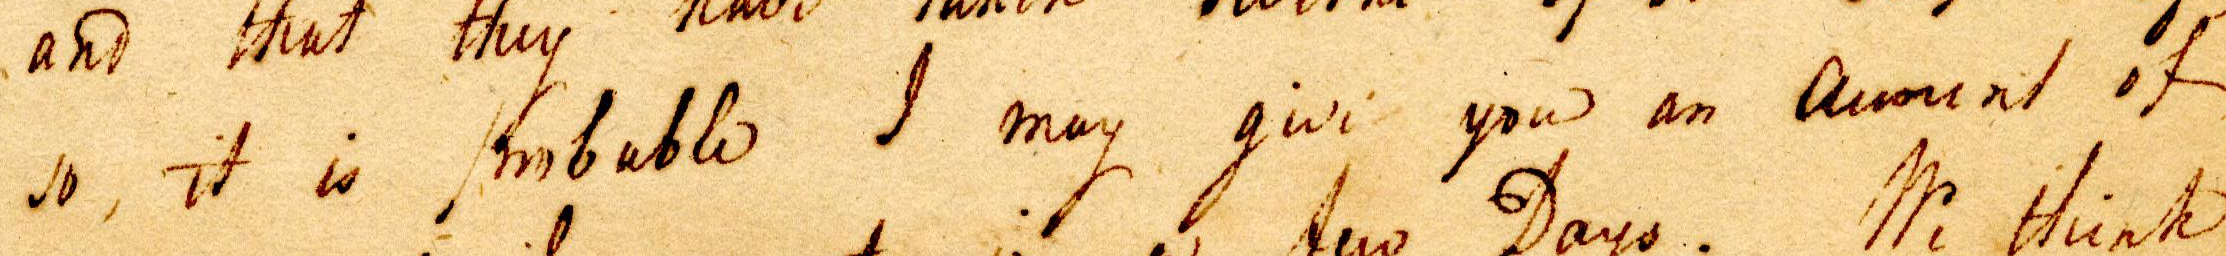so, it is rbable I may givi you an Acount 5f
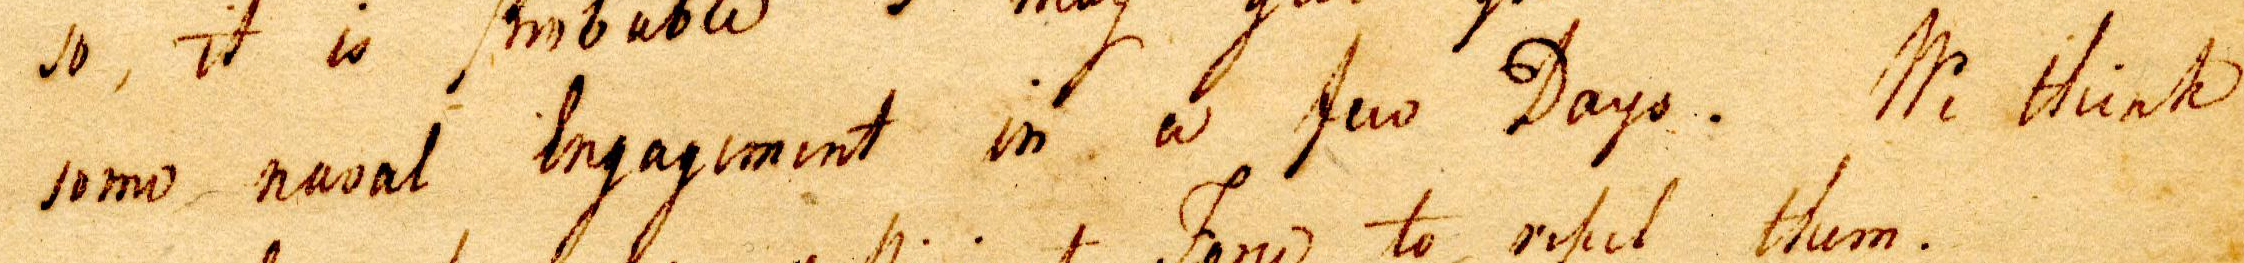some naval Engagiment in a few Days. We think
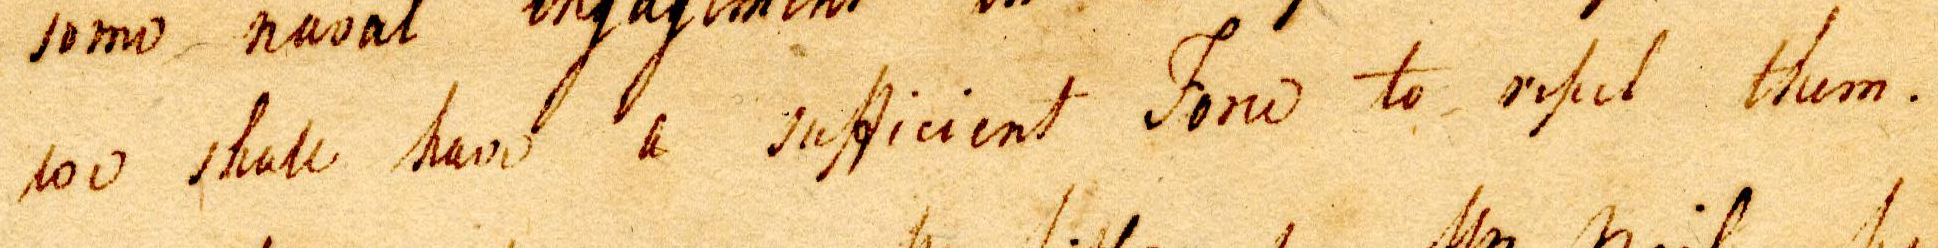100 shall have a sufficient sone to sepet them
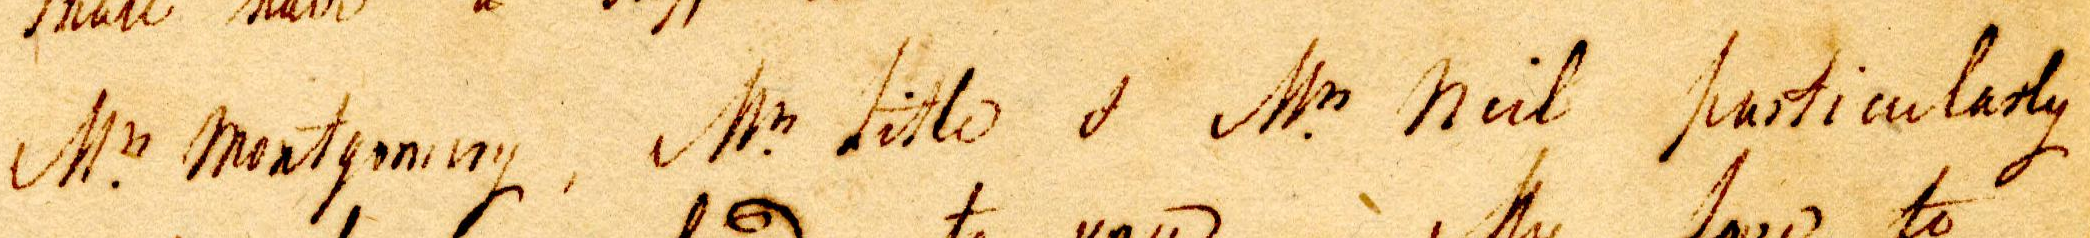M^r. Monljenerg, M^r. Sitle & M^r. Neil particulasle
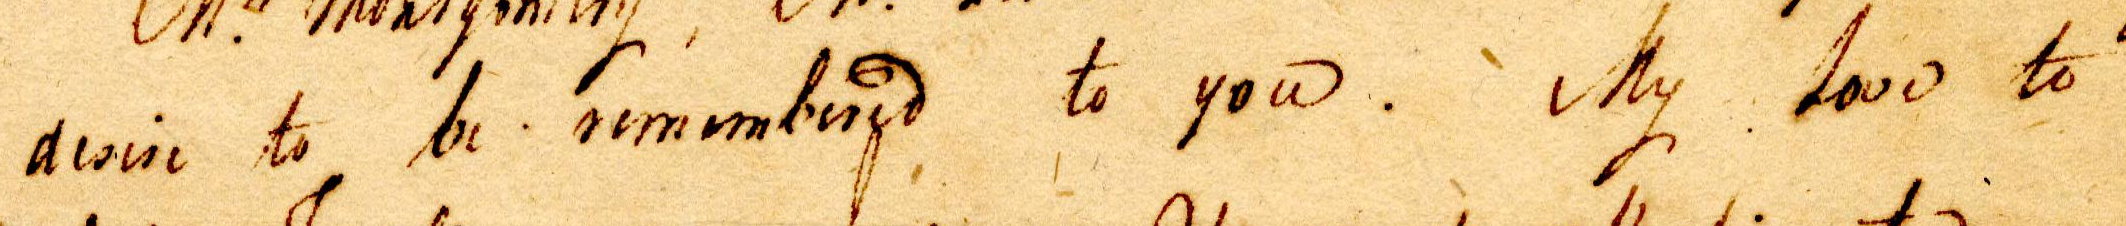disin to be remembing'd to you. My Love to
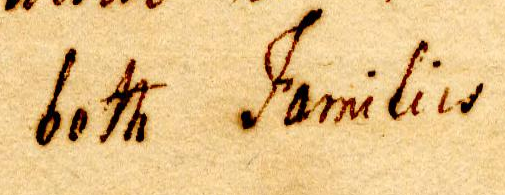both Jamiliern
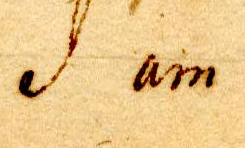I am
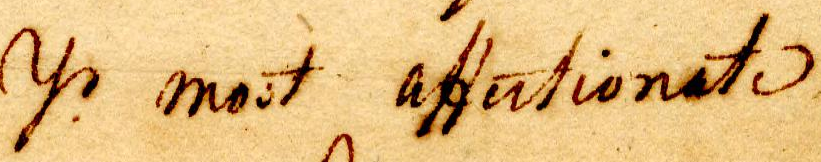fr most affectionate
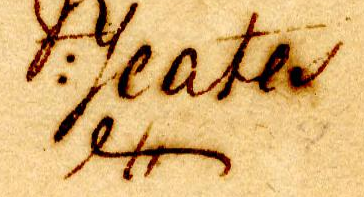Peates
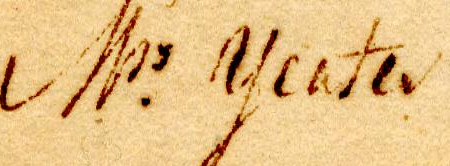Th. Yete
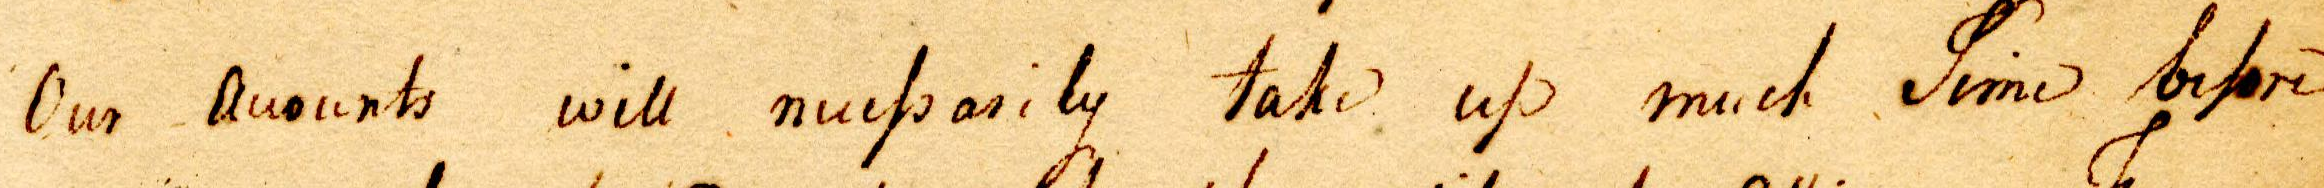Vur Accounts will necessasily take up much sime befeor
